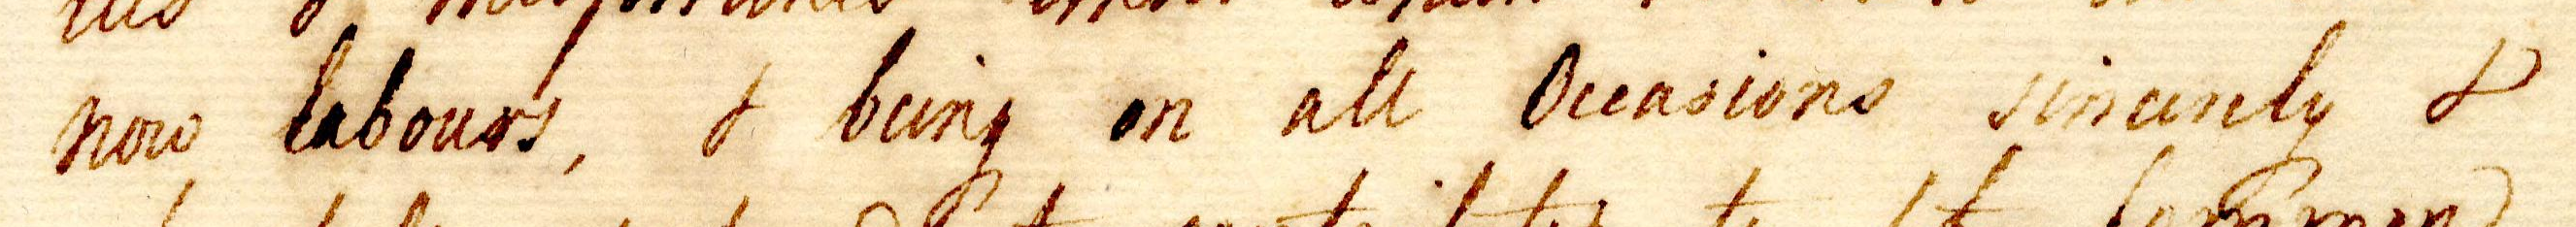now labours, & being on all Occasions sincerely &
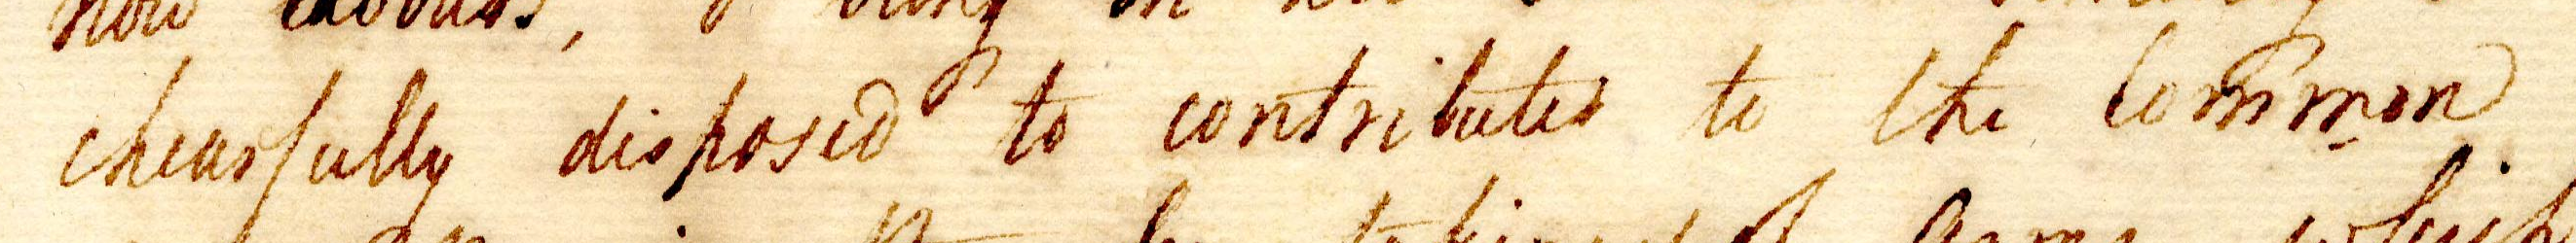chearfully disposed to contribute to the Common
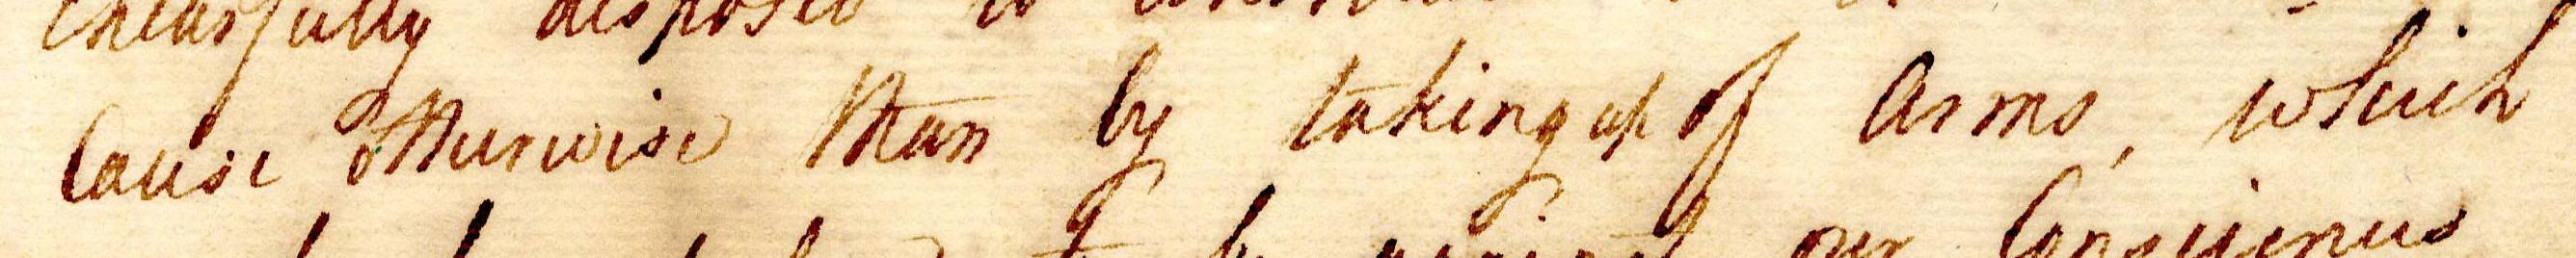Cause otherwise than by taking up of Arms, which
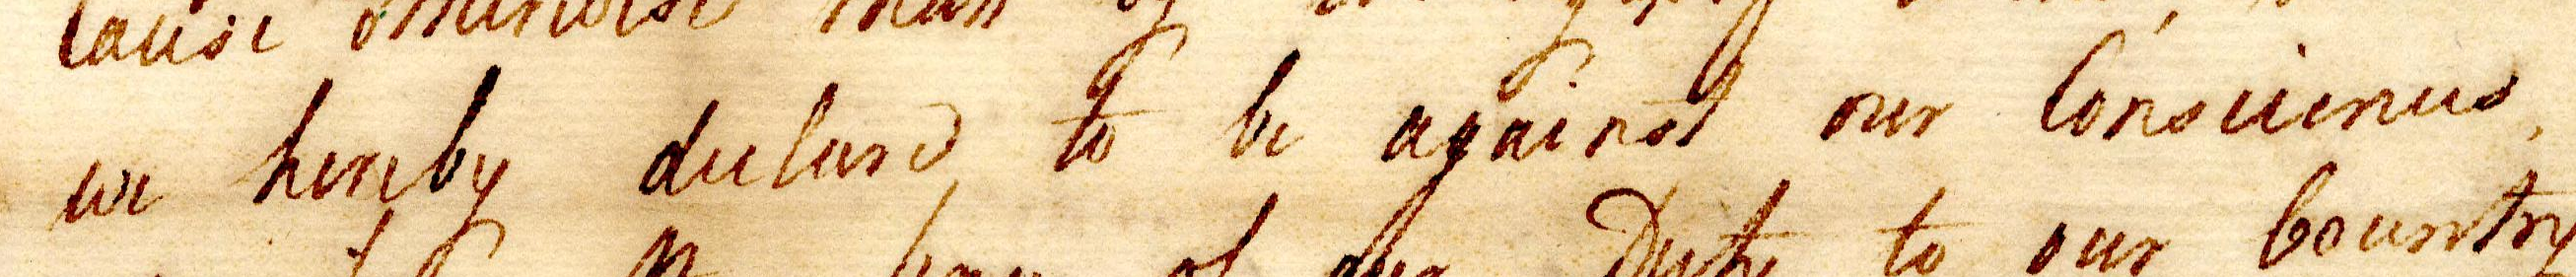we hereby declare to be against our Consciences
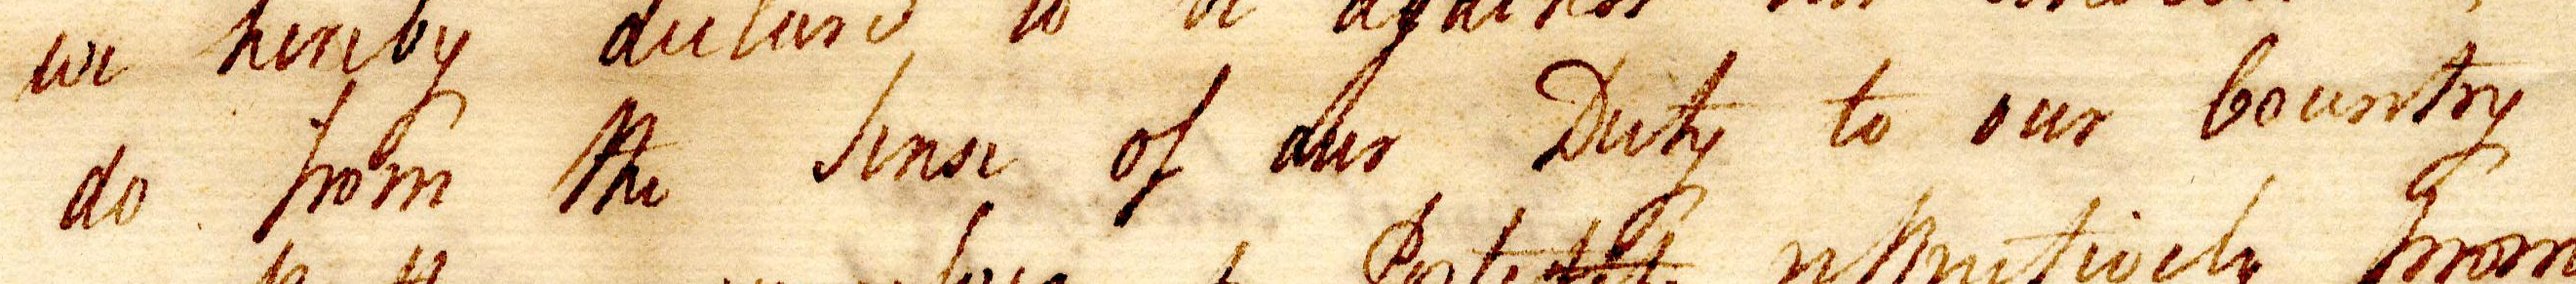do from the Sense of our Duty to our Country
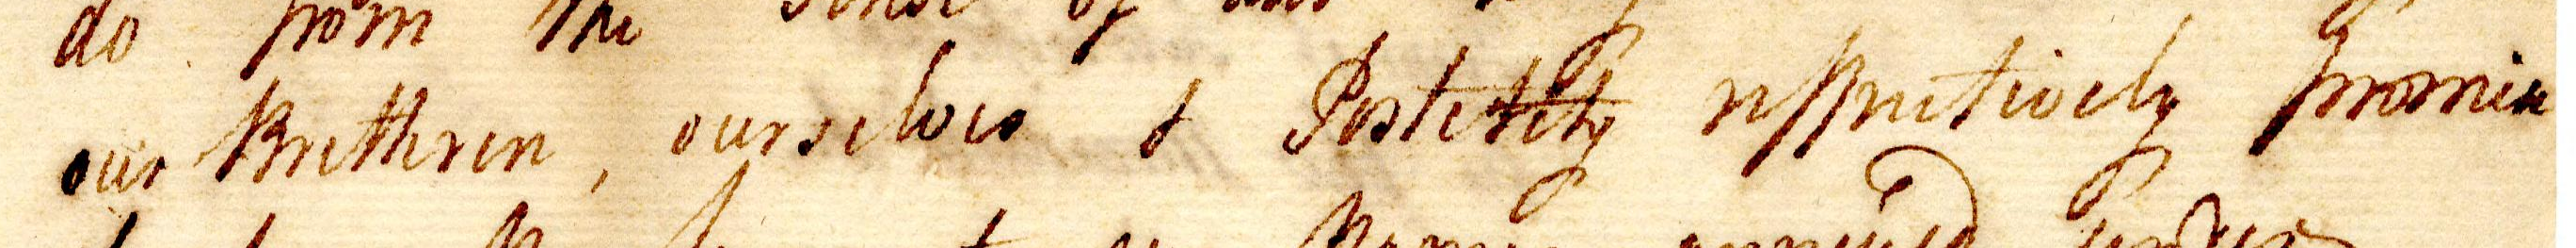our Brethren, ourselves & Posterity respectively promise
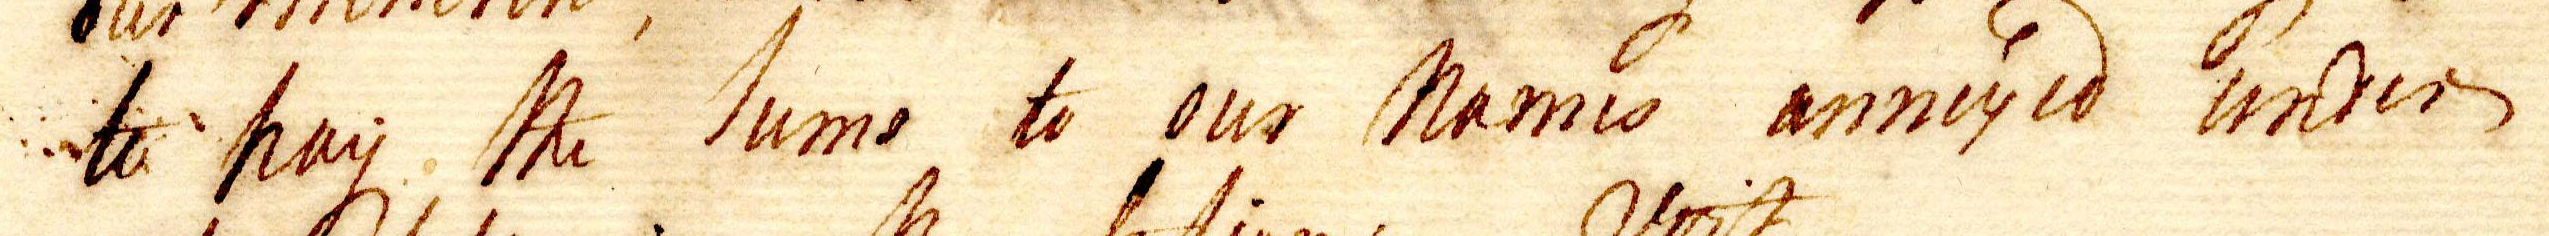to pay the Sums to our names annexed under
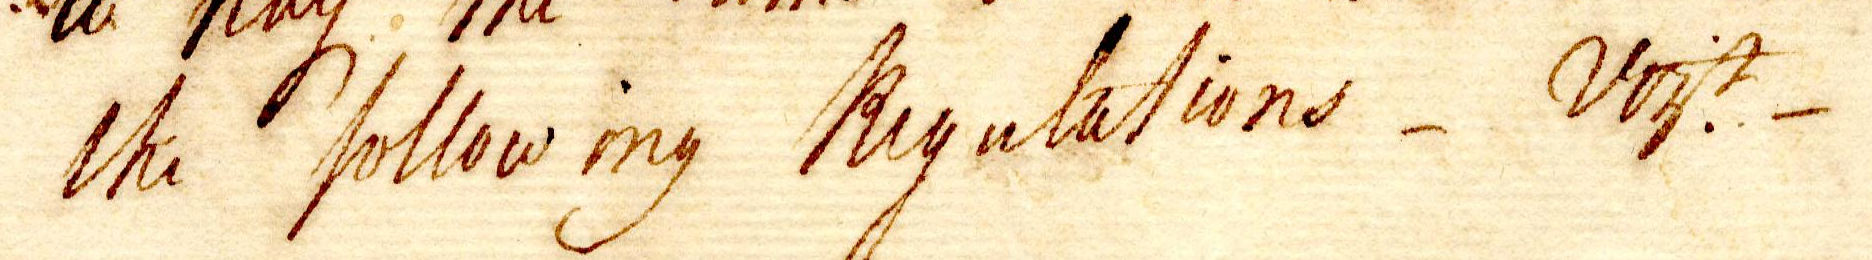the following Regulations. Viz^t.
